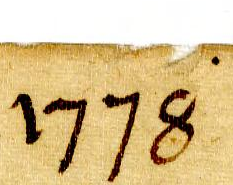1778
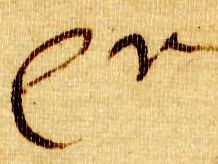C^r
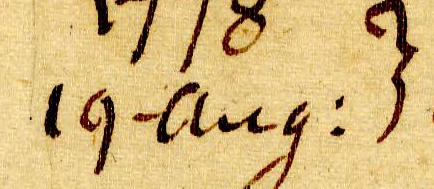19 Aug:
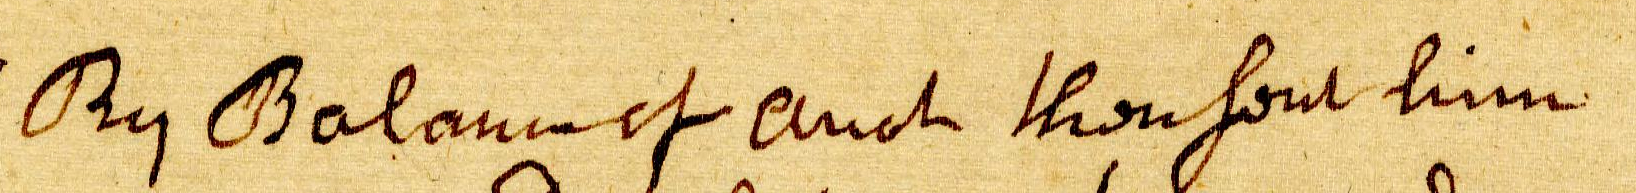By Balance of Acco^t then sent him
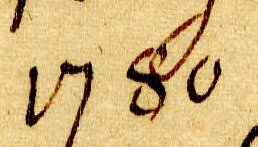1780
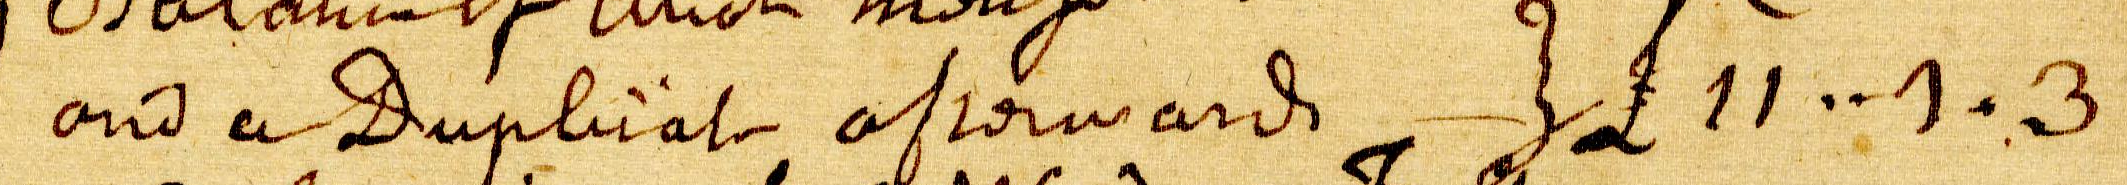and a Duplicate afterwards- £ 11..1.3
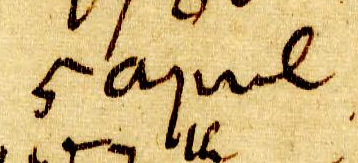5 April
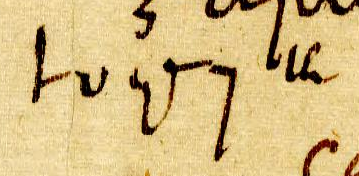to y^e 7^th
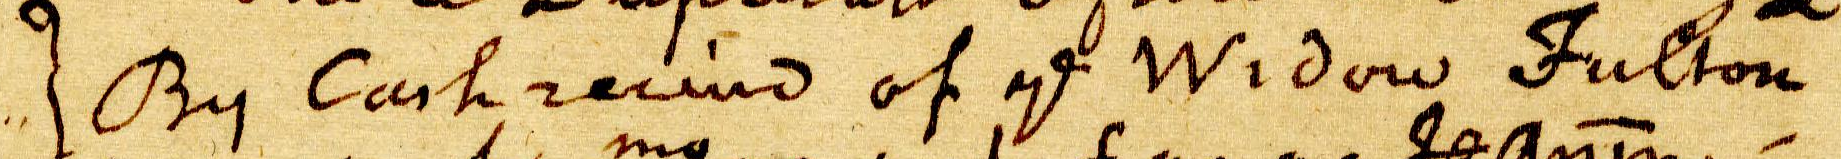By Cash received of y^e Widow Fulton
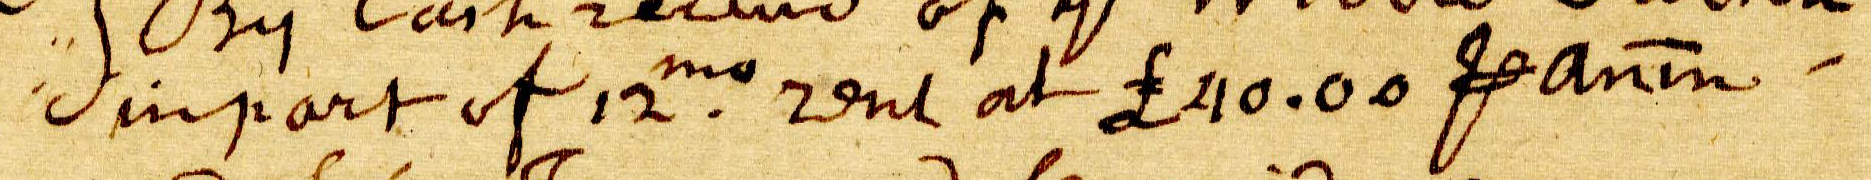in part of 12^mo. rent at £40.00 per Ann -
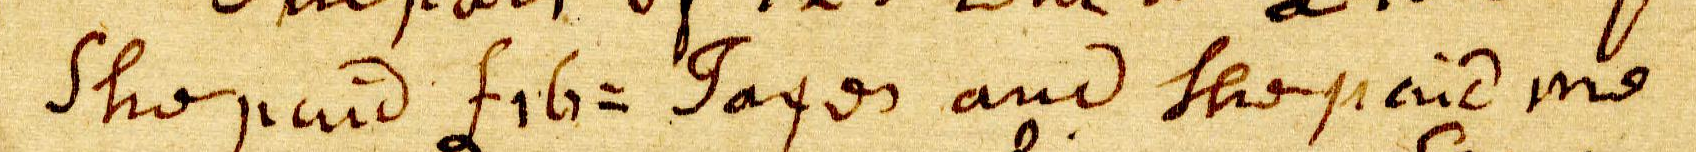She paid £16: Taxes and she paid me
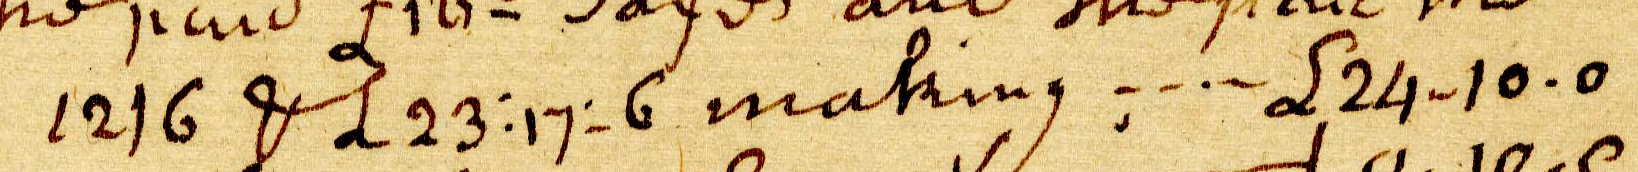12/6 & £23:17:6 making... £24.10.0
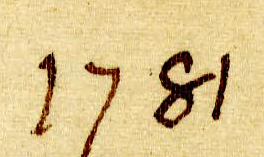1781
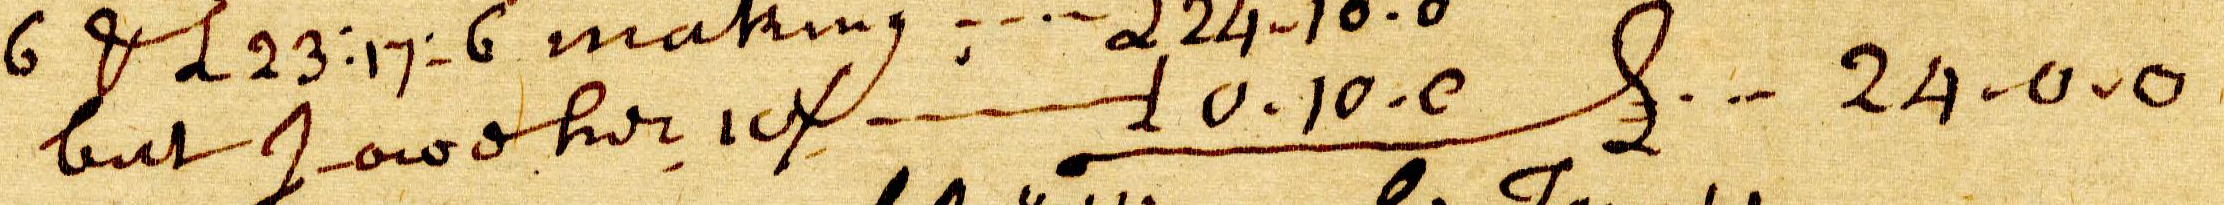but I owe her 10s- 10.10.0 £ 24.0.0
